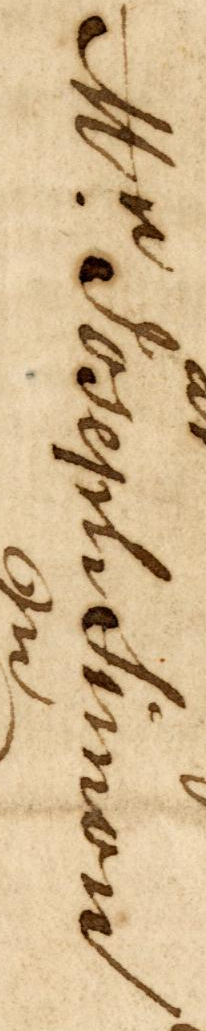M^r. Joseph Simon
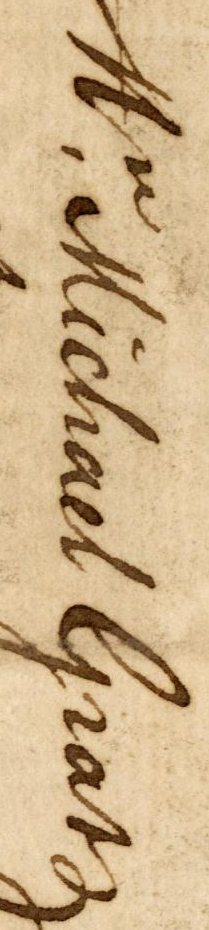M^r Michael Gratz
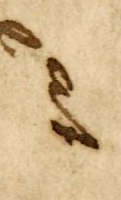at
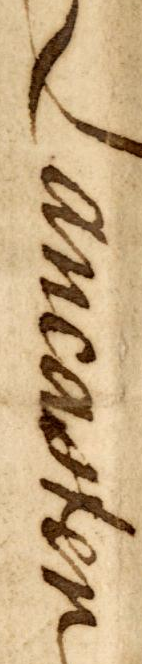Lancaster
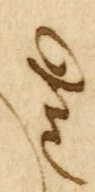in
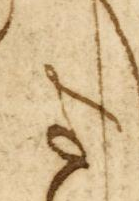To
